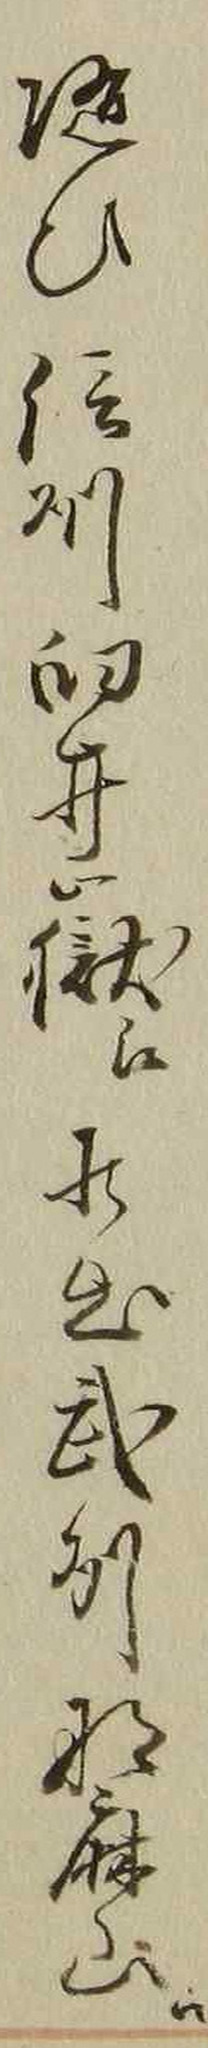随ひ信州臼井岳江打出武州那麻山江
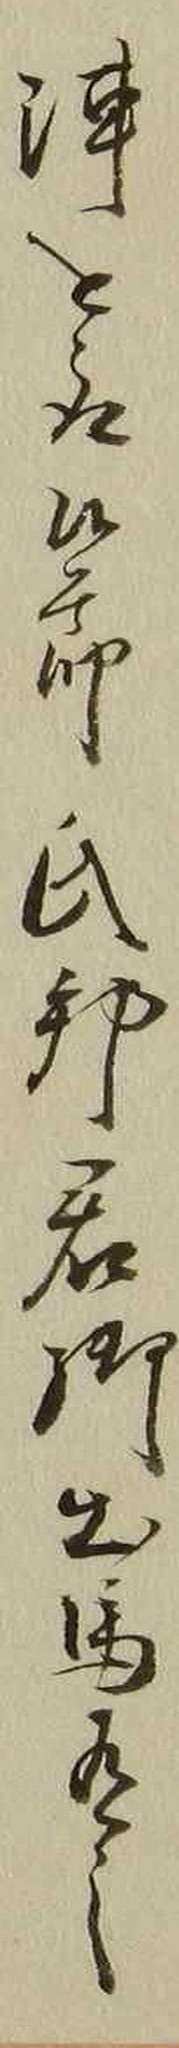陣を取候節氏邦君御出馬有之
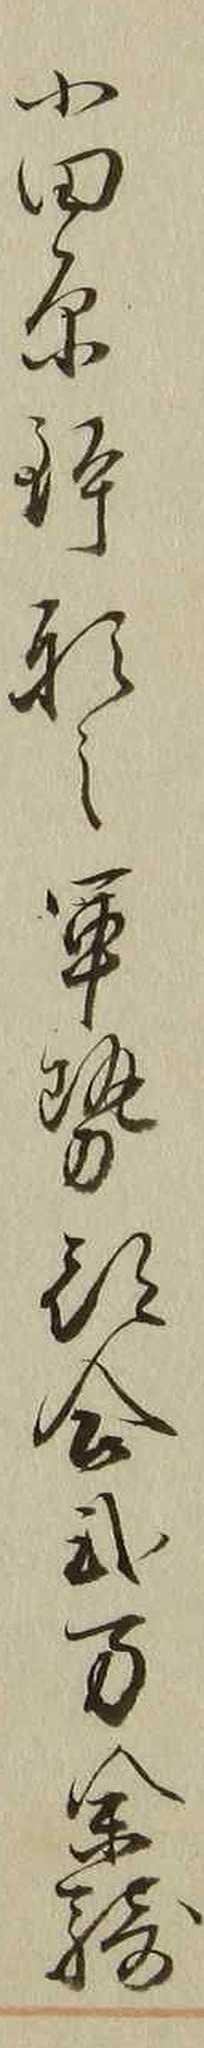小田原鉢形之軍勢都合弐万余騎
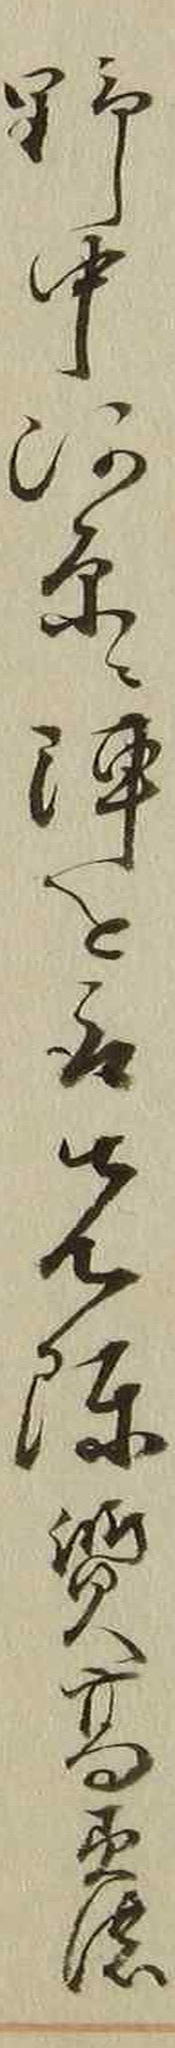野中河原ニ陣を取先陣質高美濃
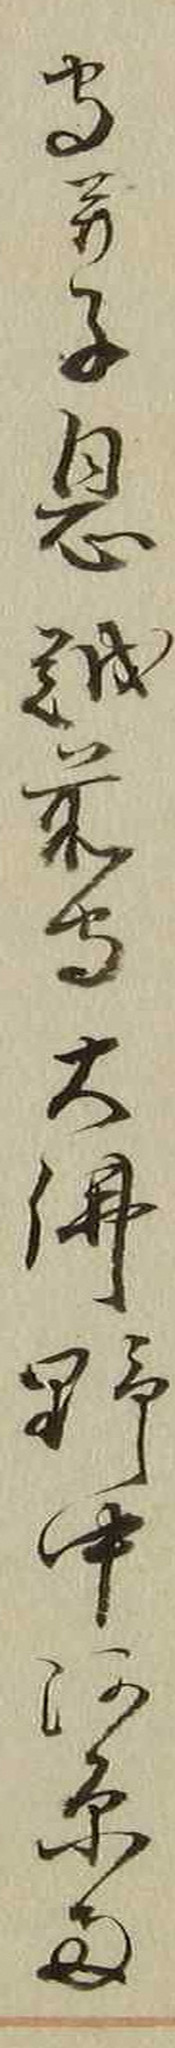守并子息越前守大仏野中河原両
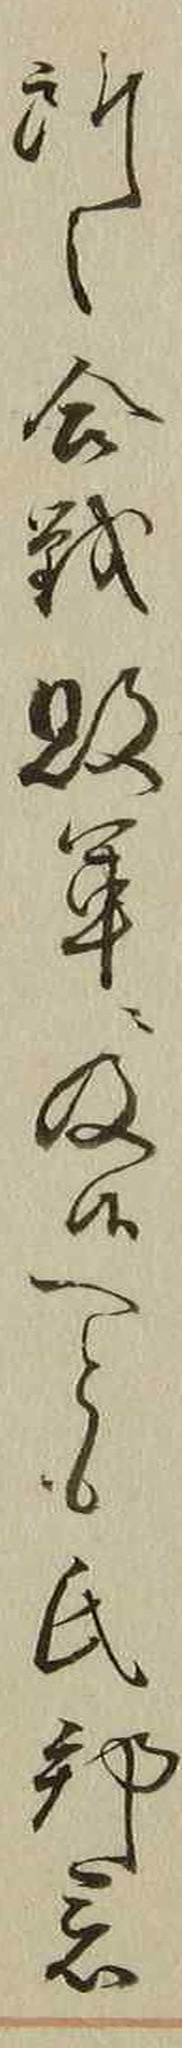所之合戦敗軍ニ及候へとも氏邦君
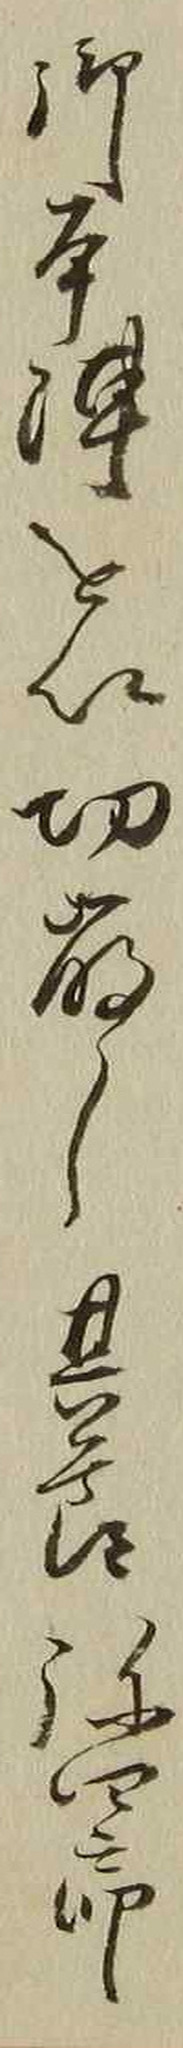御本陣を以切崩し其節弥四郎
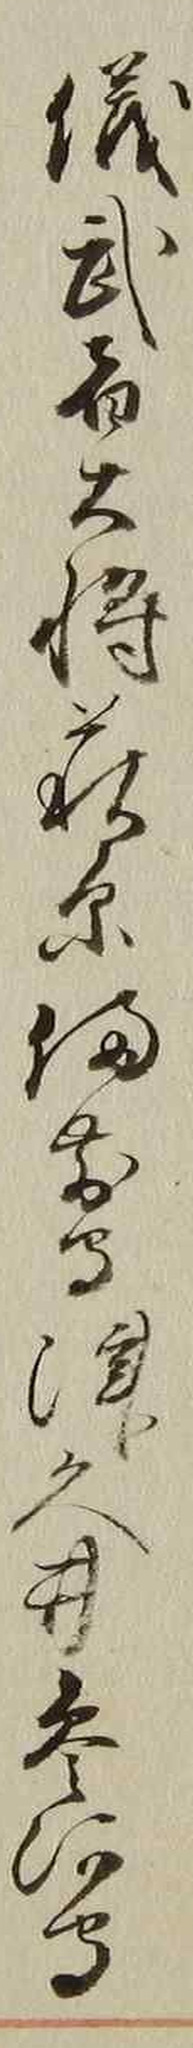儀武者大将萩原備前守津久井参河守
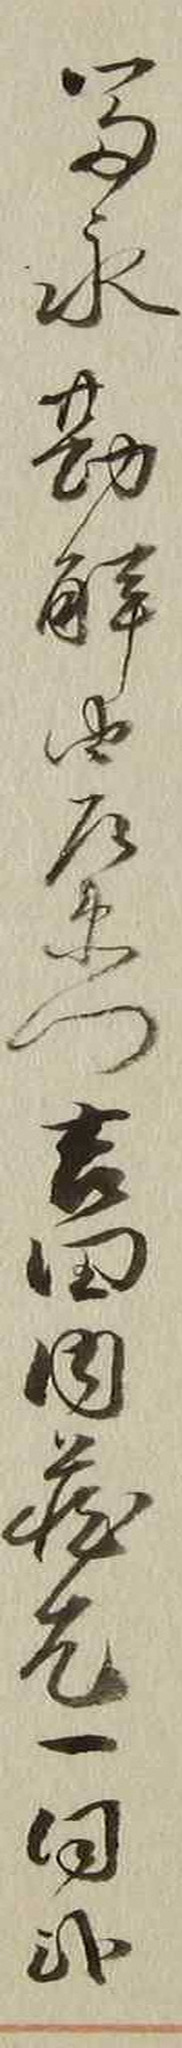富永勘解由左衛門吉田内蔵允一同弐
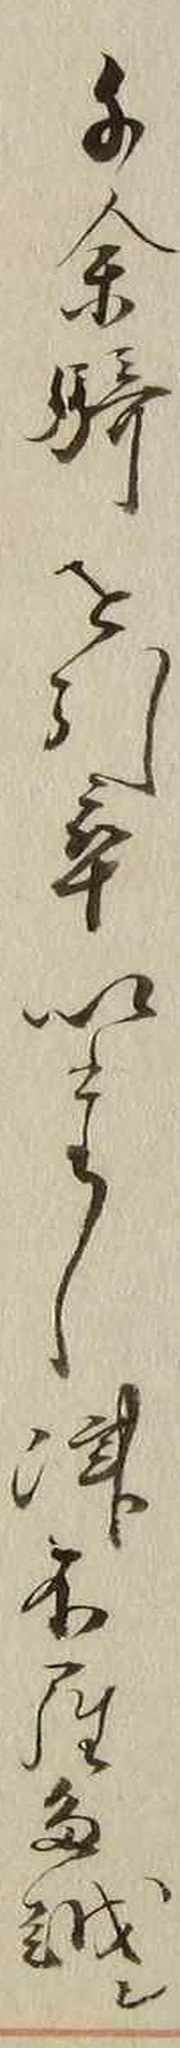千余騎を引率いたし津不羅多越シ
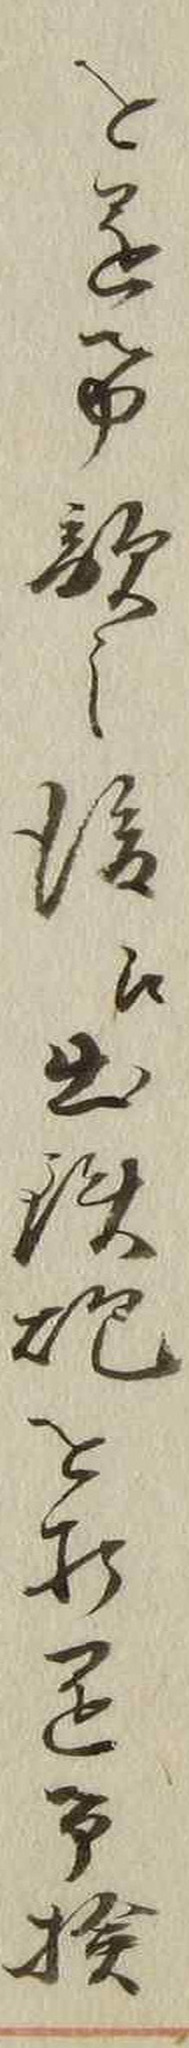を懸け敵之後江出鉄炮を打懸け検
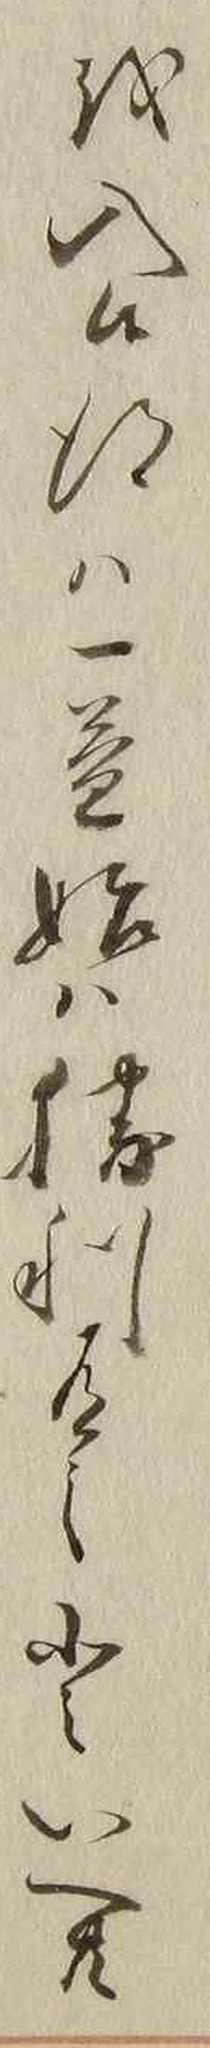を入候得ハ一益始ハ勝利有之といへ共
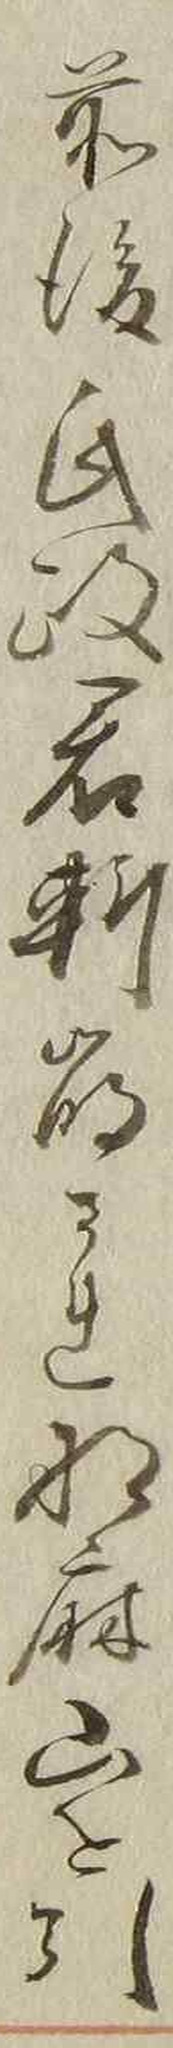前後氏政君斬崩され那麻山を引
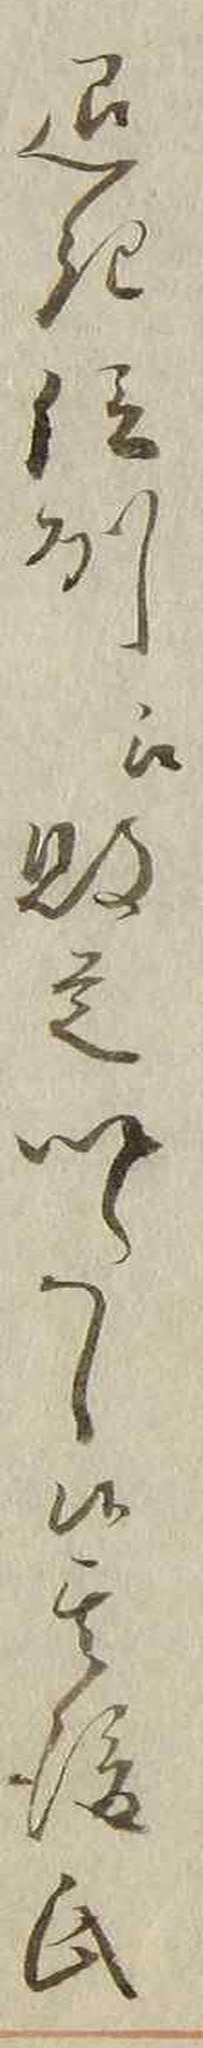退き信州江敗走いたし候其後氏
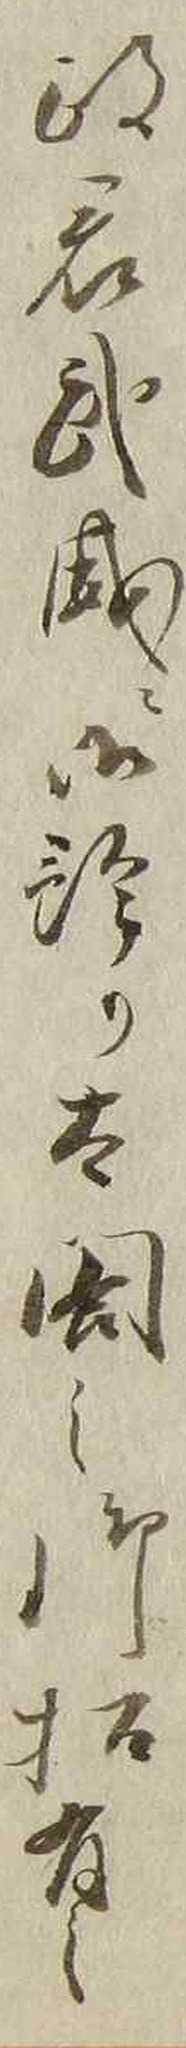政君武威ニ御預り太閤之御招有之
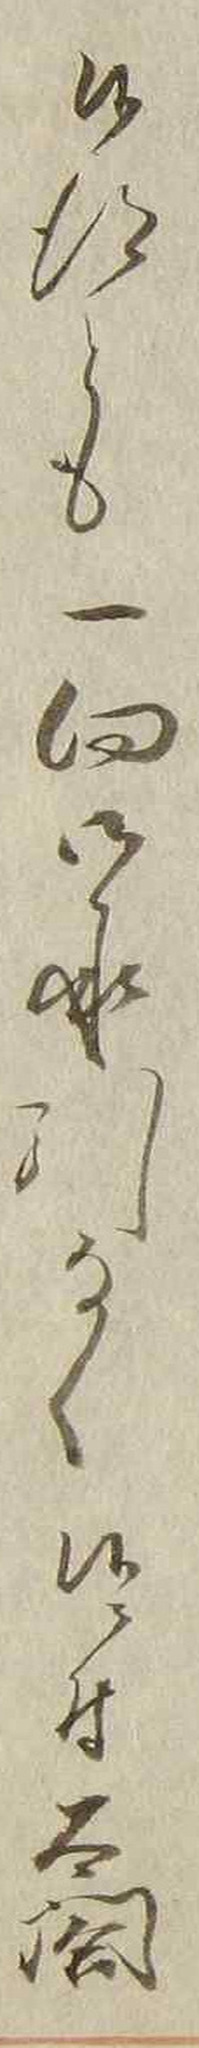候得とも一向御承引なく候ニ付太閤
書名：諸士系譜　巻之122　よ之部5
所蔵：会津若松市立会津図書館
